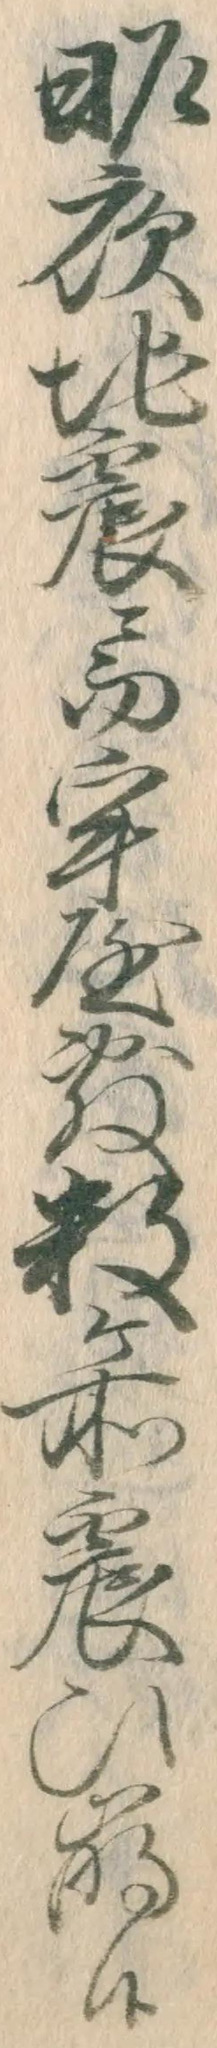昨夜地震ニて牢屋敷数ケ所震ひ崩候
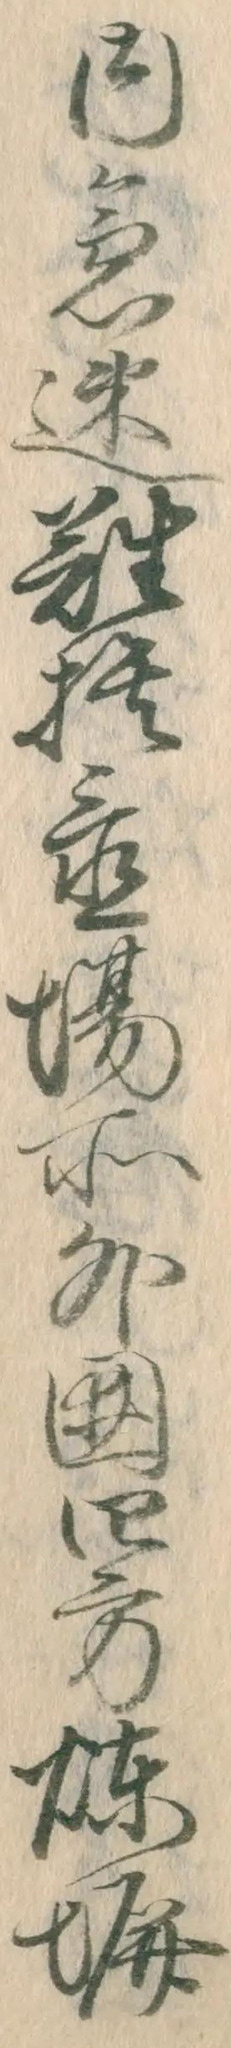内急速難捨置場所外囲四方煉塀

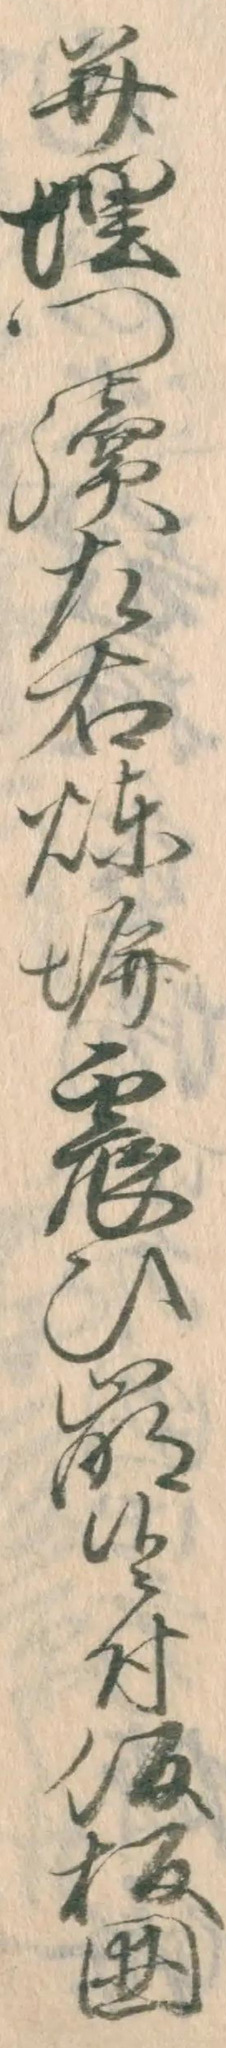幷埋門続左右煉塀震ひ崩候ニ付仮板囲
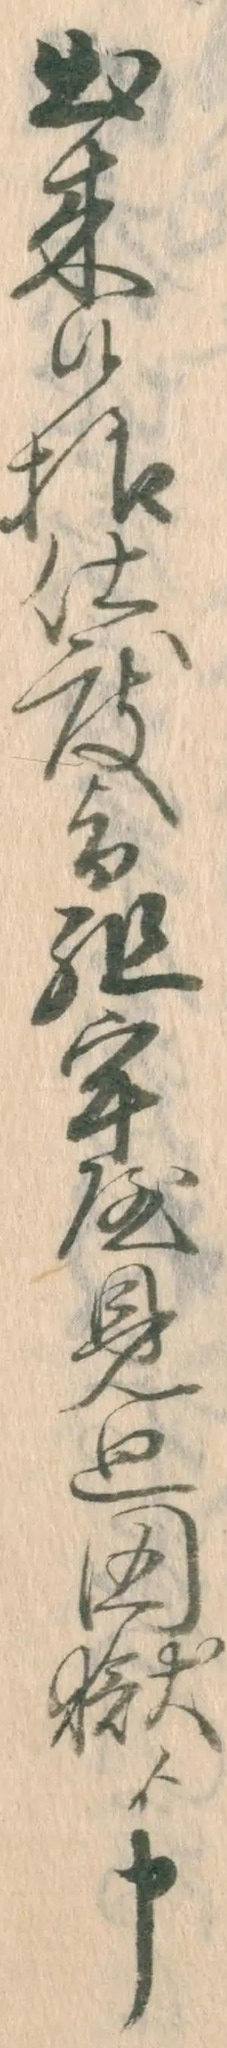出来候様仕度旨組牢屋見廻囚獄ゟ申
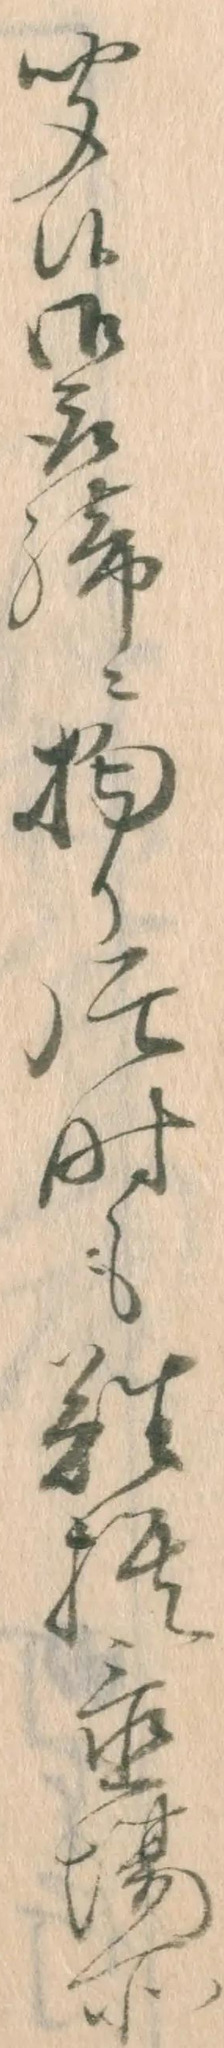聞候御取締ニ拘り片時も難捨置場所
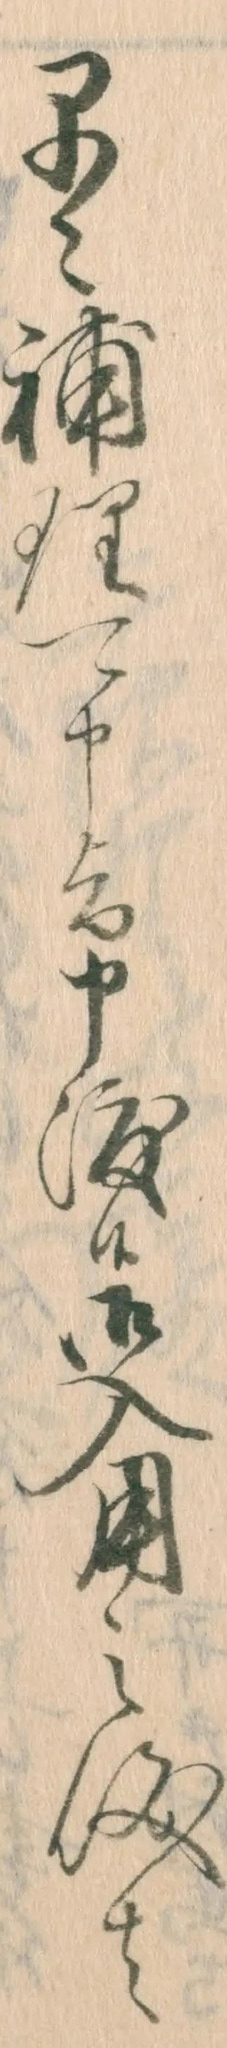早〻補理可申旨申渡候御入用之儀は
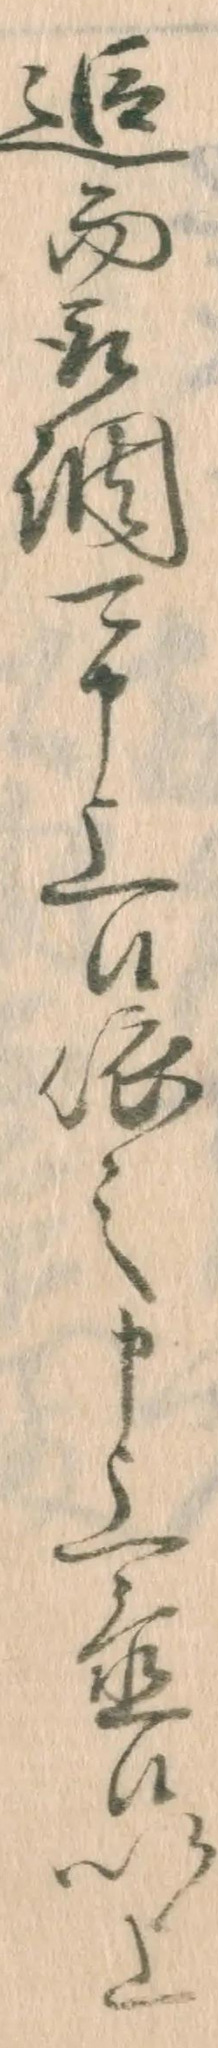追て取調可申上候依之申上置候以上
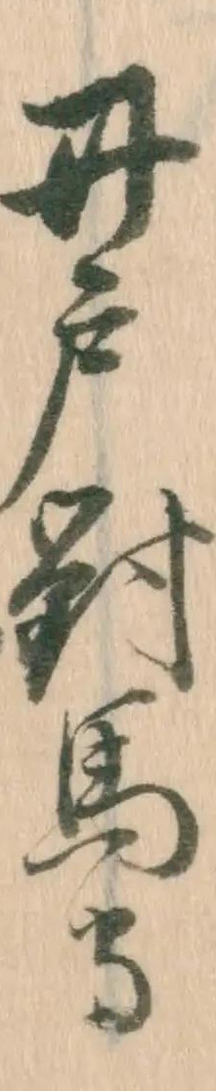│[井戸対馬守
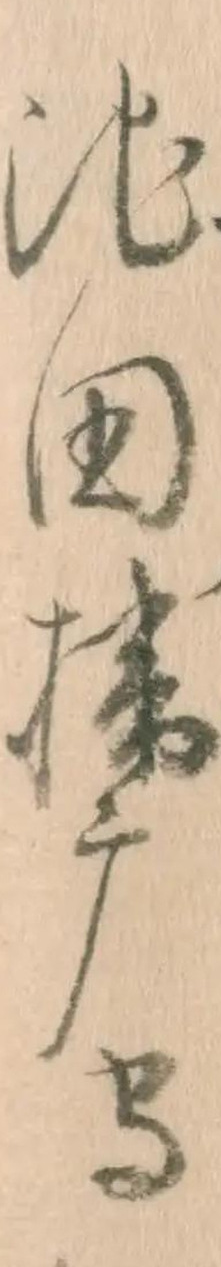池田播磨守
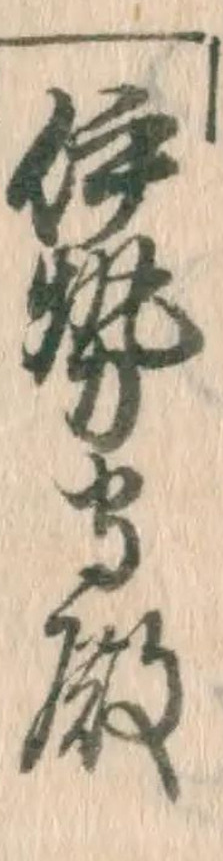│[伊勢守殿
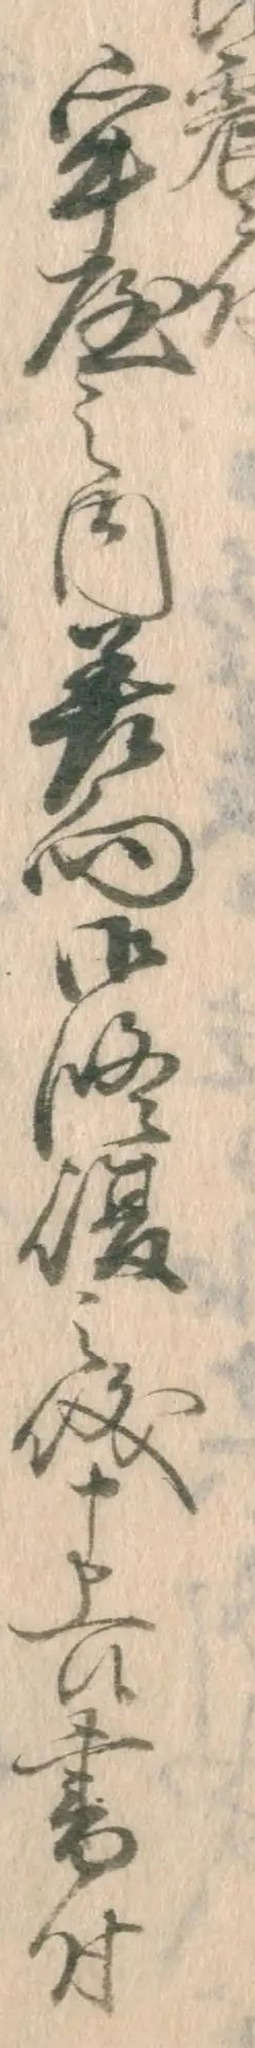│牢屋之内差向御修復之儀申上候書付
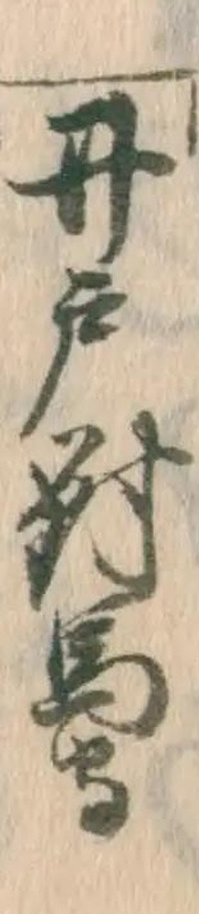│[井戸対馬守
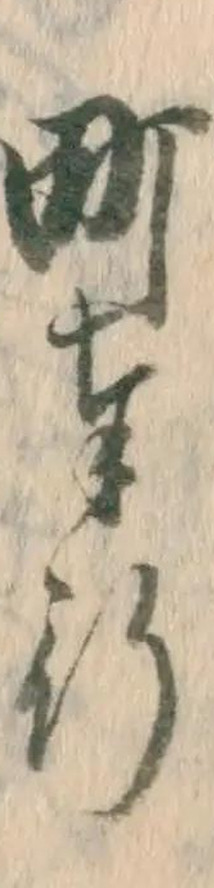│町奉行
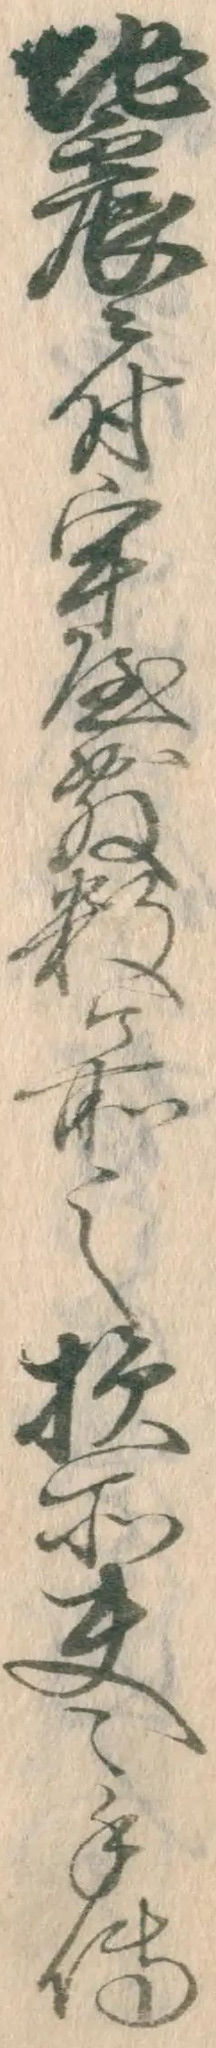地震ニ付牢屋敷数ケ所之損所夫〻手伝
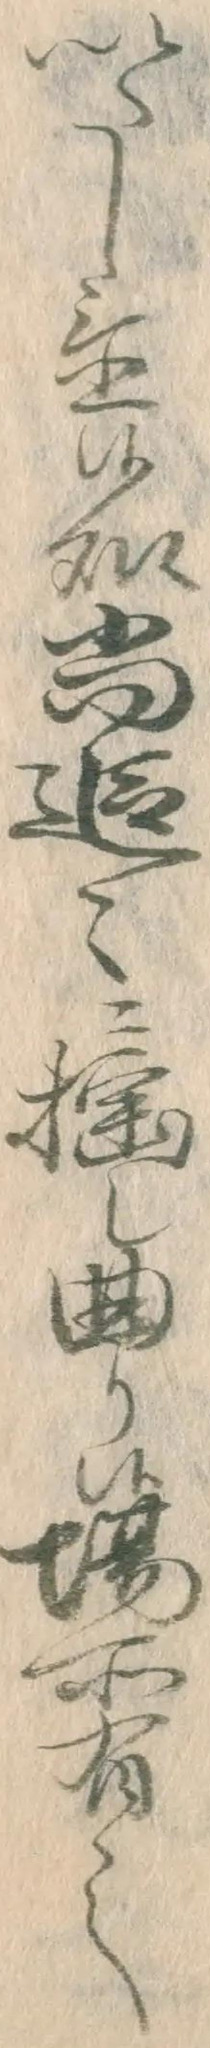いたし置候処尚追〻ニ揺レ曲り候場所有之

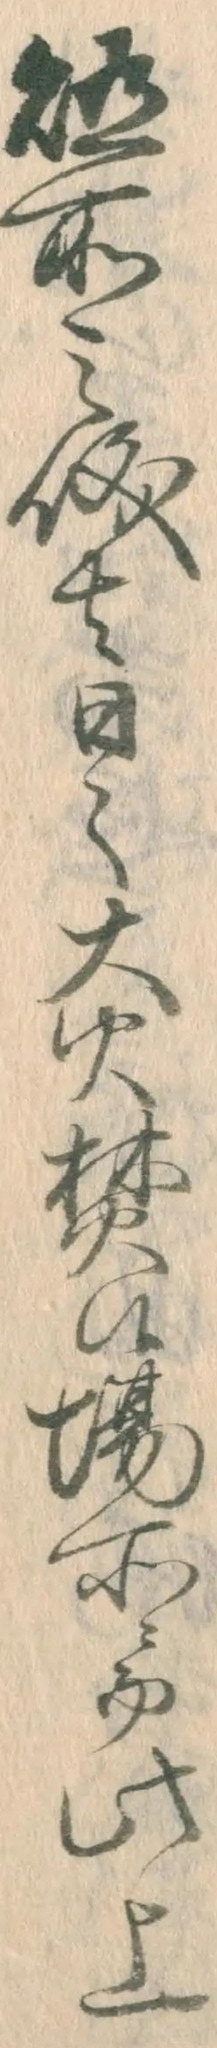賄所之儀は日〻大火焚候場所ニて此上
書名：七十冊物類集 71巻. [44] 四十三 牢屋敷御普請御修覆地震ニ付骨折候牢屋掛御褒美之部
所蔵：国立国会図書館 National Diet Library, JAPAN
